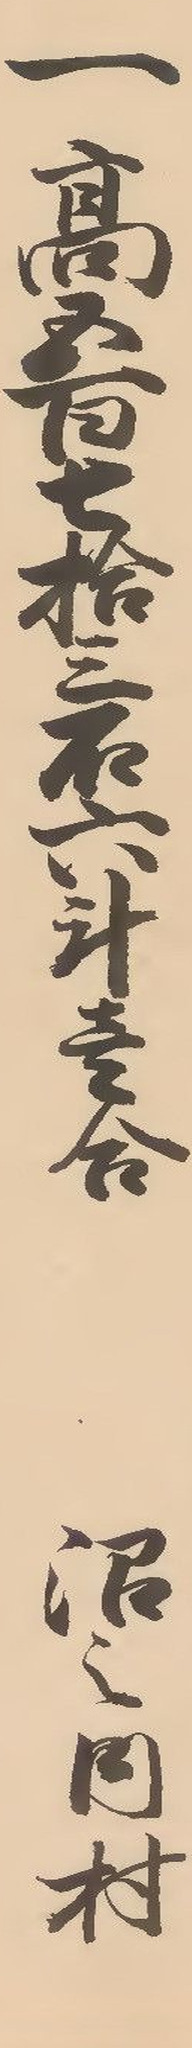一高五百七拾三石六斗壱合沼之内村
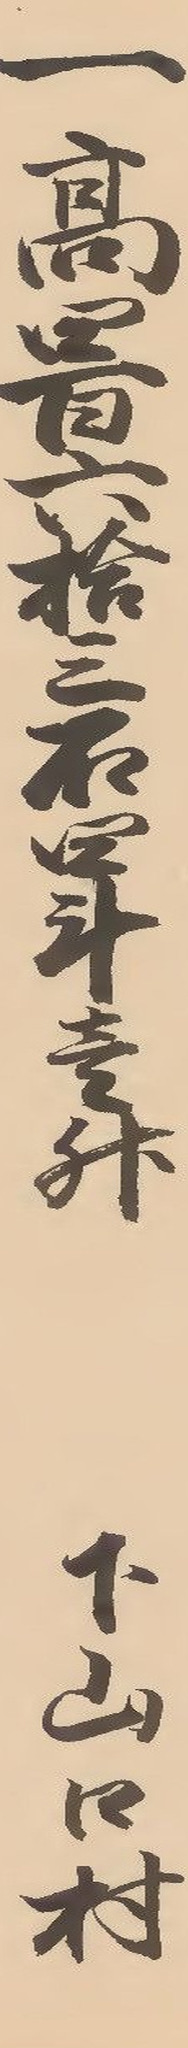一高四百六拾三石四斗壱升下山口村
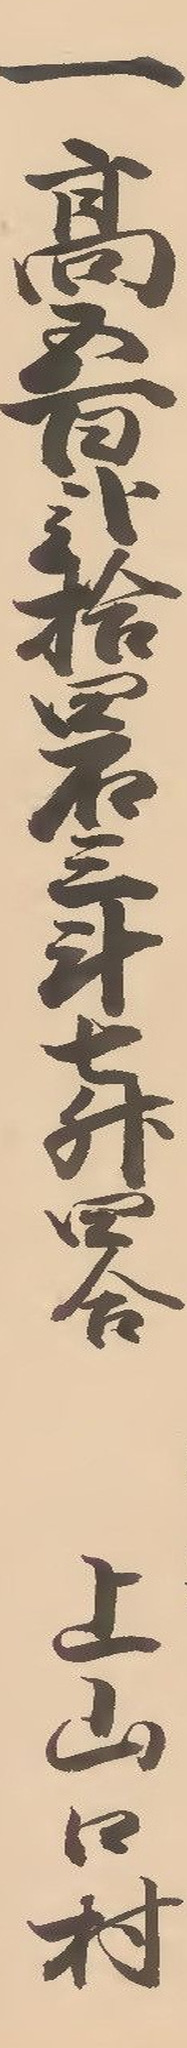一高五百弐拾四石三斗七升四合上山口村
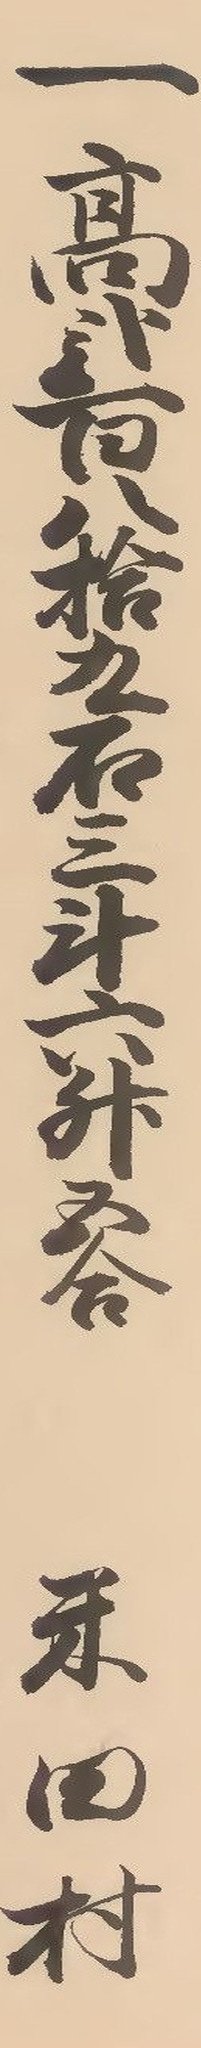一高弐百八拾九石三斗六升五合米田村
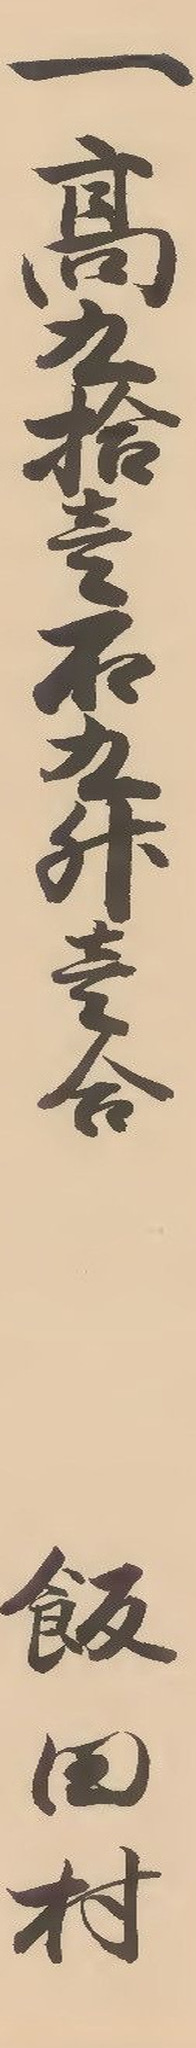一高九拾壱石九升壱合飯田村
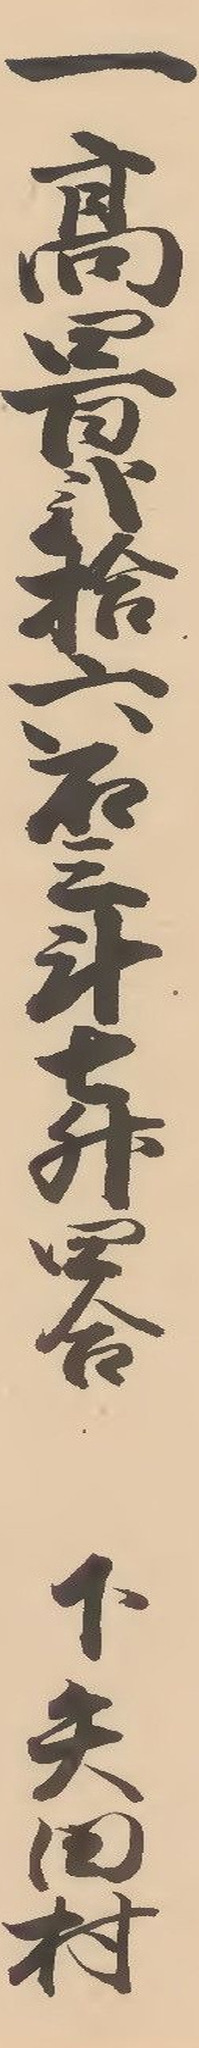一高四百弐拾六石三斗七升四合下矢田村
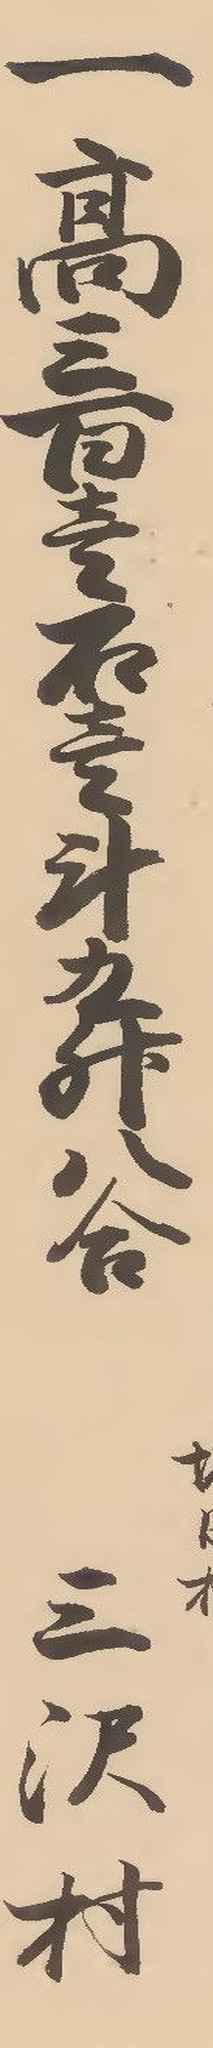一高三百壱石壱斗九升八合三沢村

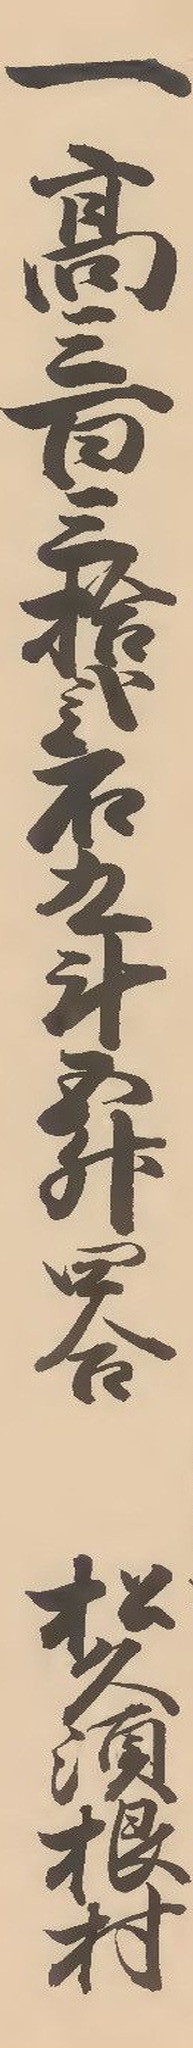一高三百三拾弐石九斗五升四合松久須根村
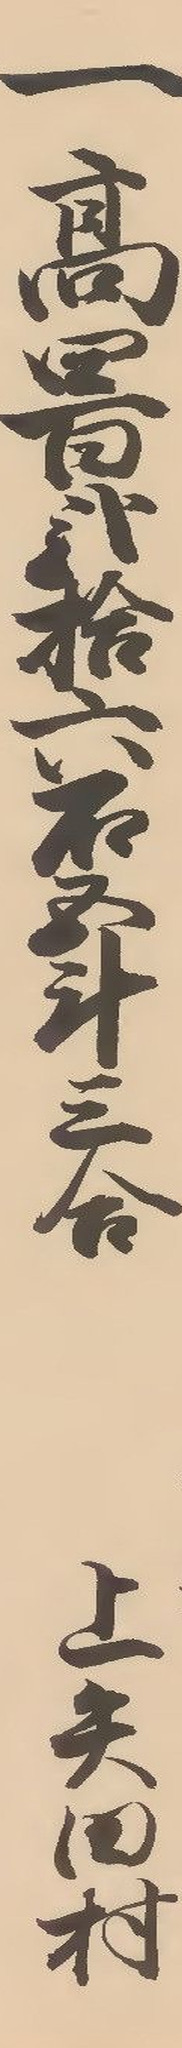一高四百弐拾六石五斗三合上矢田村
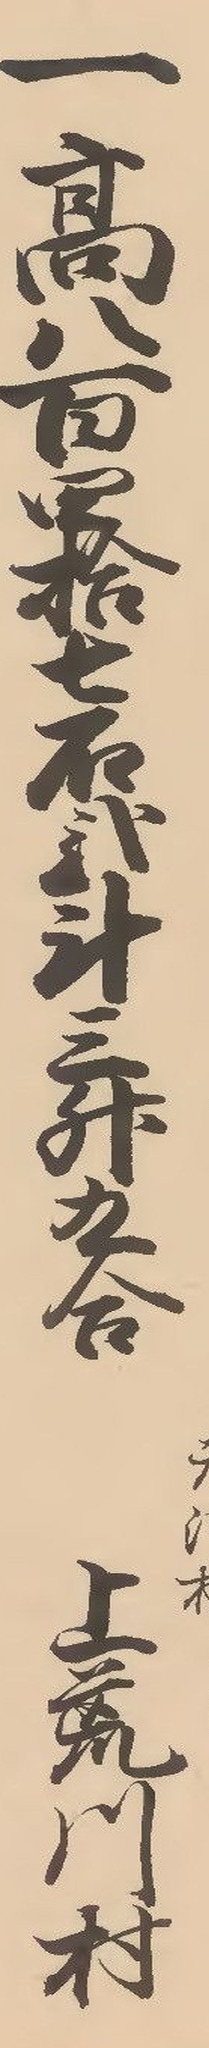一高八百四拾七石弐斗三升九合上荒川村
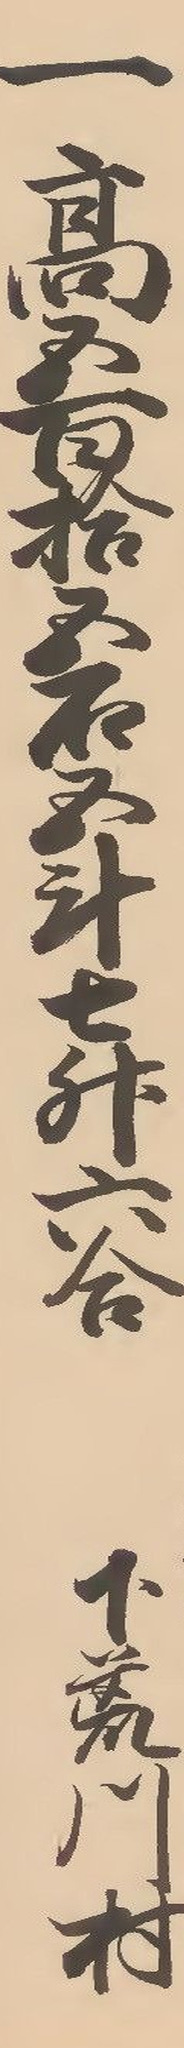一高五百拾五石五斗七升六合下荒川村
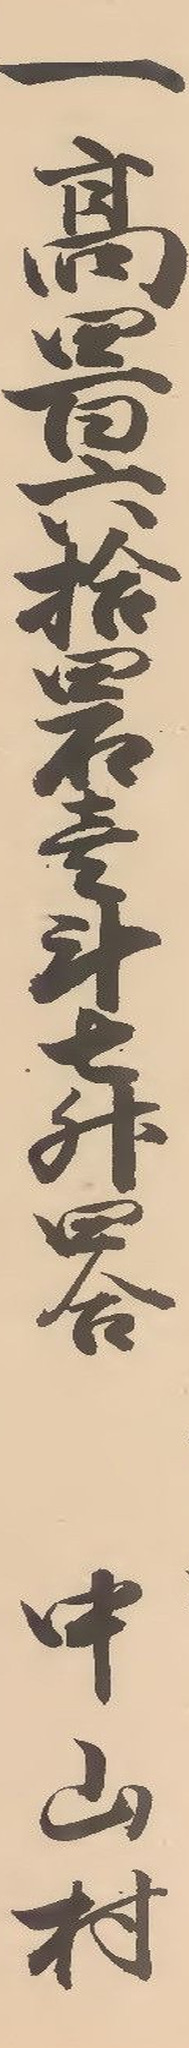一高四百六拾四石壱斗七升四合中山村
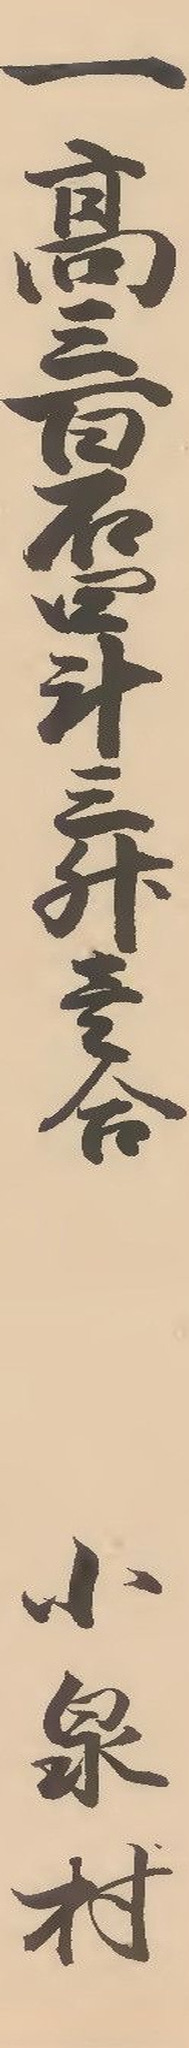一高三百石四斗三升壱合小泉村
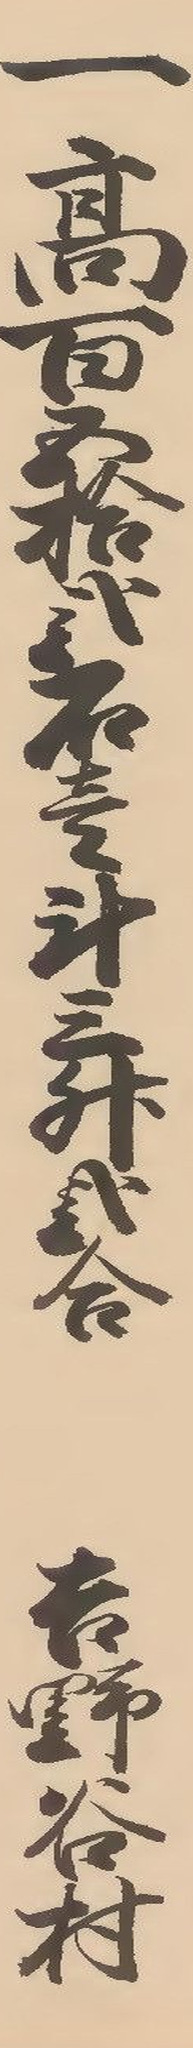一高百五拾弐石壱斗三升弐合吉野谷村

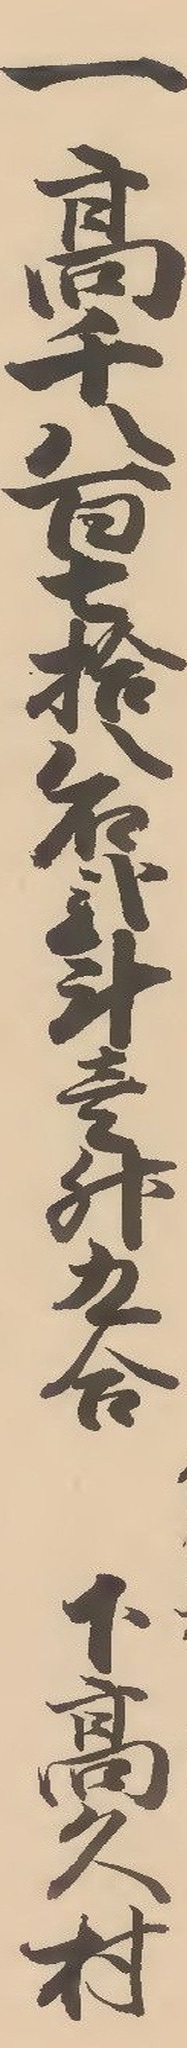一高千八百七拾八石弐斗壱升九合下高久村
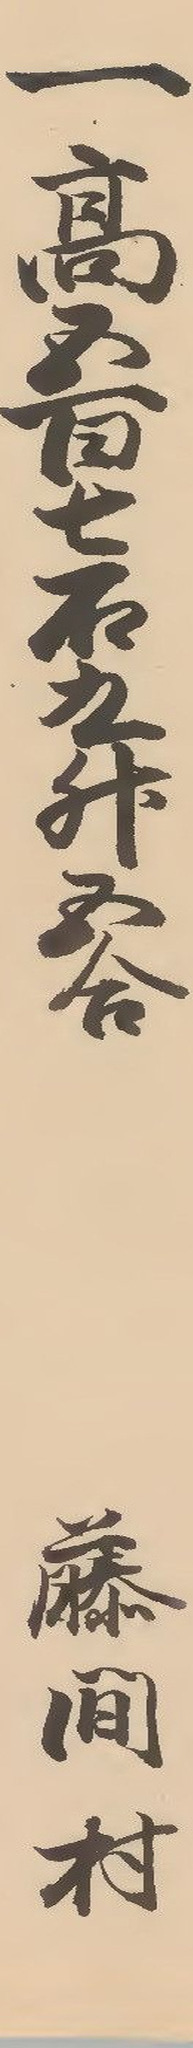一高五百七石九升五合藤間村
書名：陸奥国郷帳　３
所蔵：国立公文書館 National Archives of Japan
